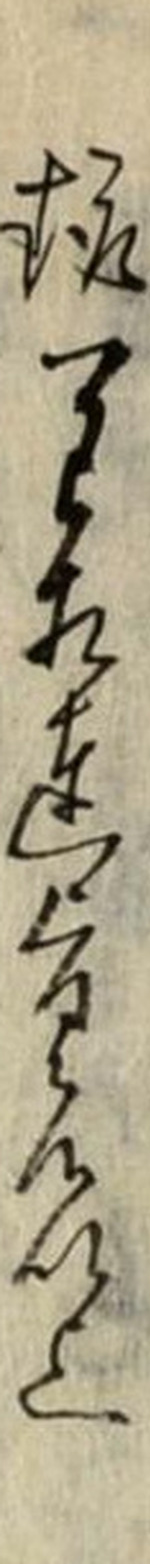趣可被相達旨に候以上
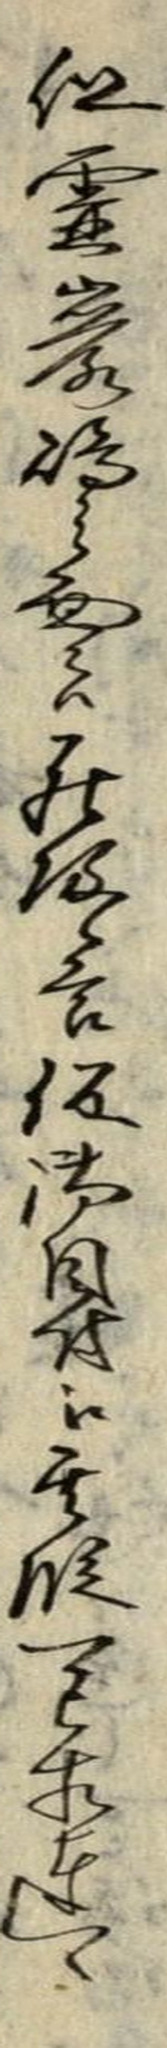但霊岸嶋之面々は罷帰候節仮御目付江其段可被相達候
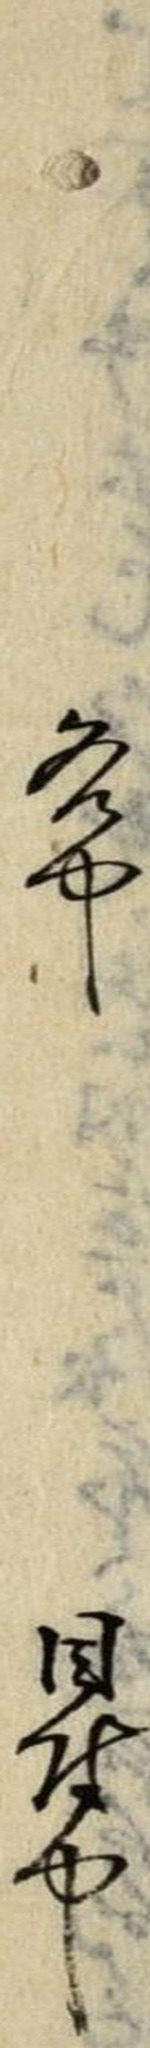各中目付中
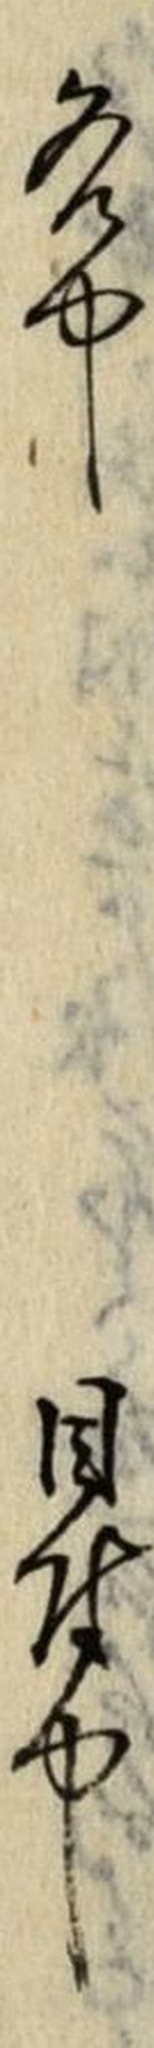各中目付中
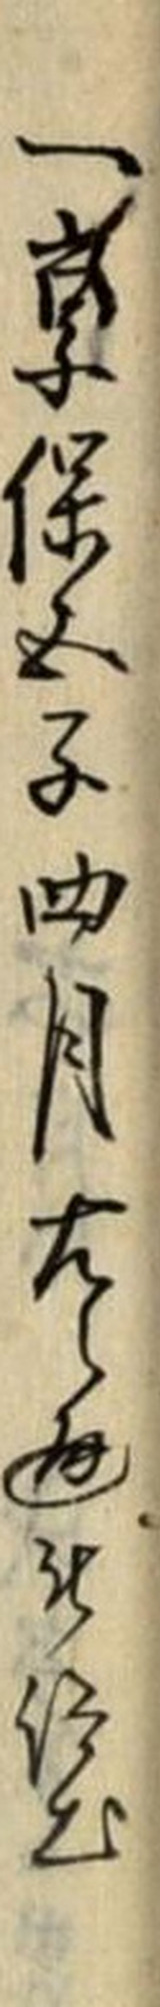一享保五子四月左之通被仰出
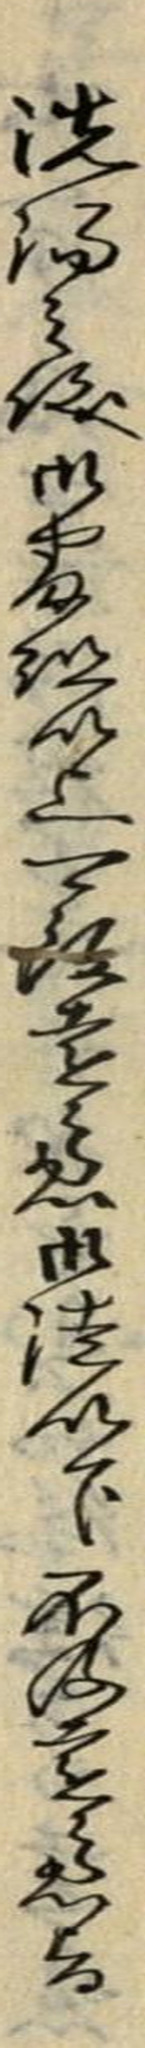洗湯之儀御番組以上可致遠慮御徒以下不及遠慮旨
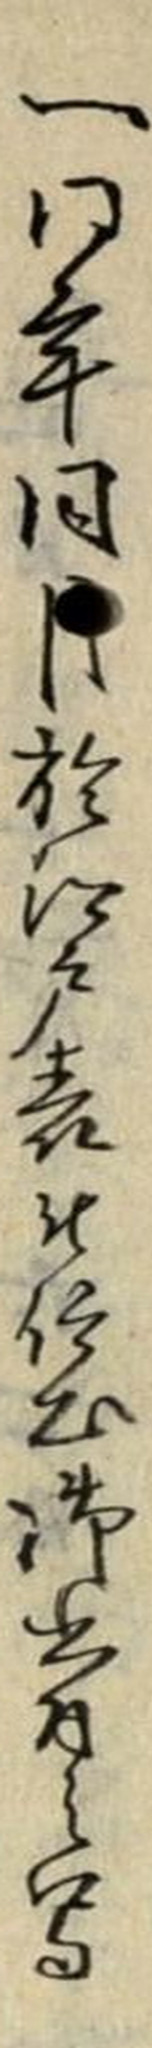一同年同月於江戸表被仰出御書付之写
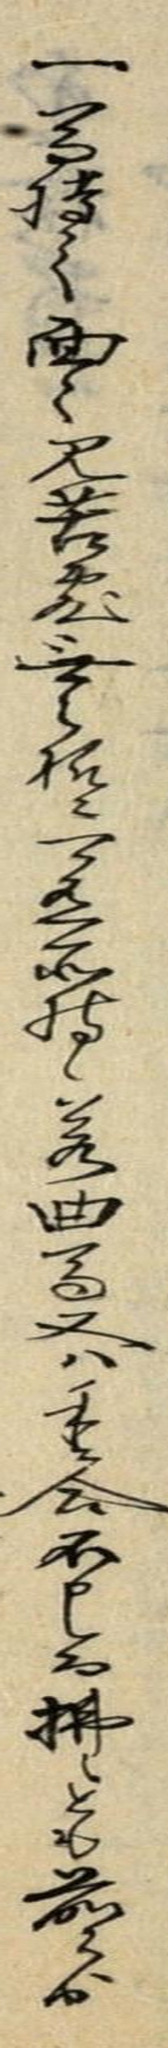一馬持之面々見苦敷無之様に可有所持候若曲馬又は手に合不申候て払候とも前々ゟ
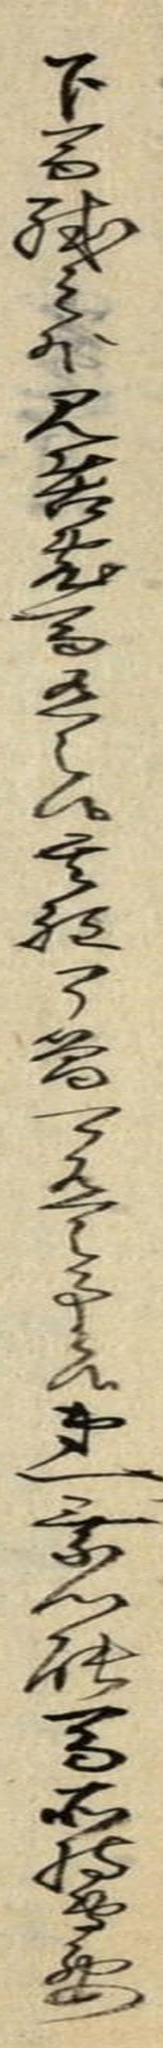下馬殊之外見苦敷馬有之候其程了簡可有之事に候第一乗心能馬所持専要
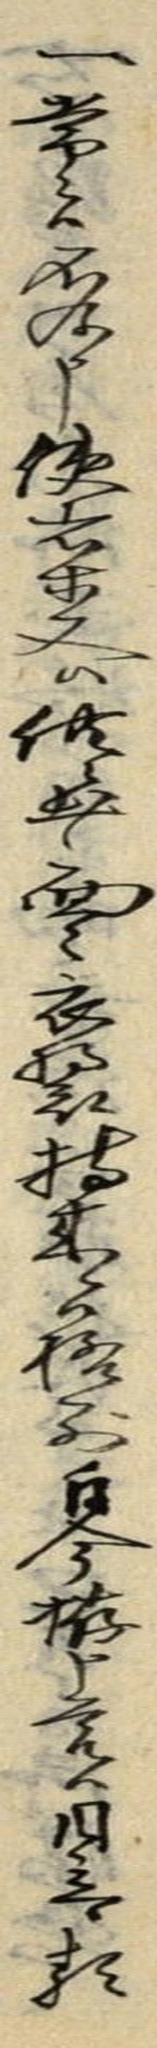一常々は不及申使者等又は供に出候面々衣装持来候は格別自今拵申節は目立候類
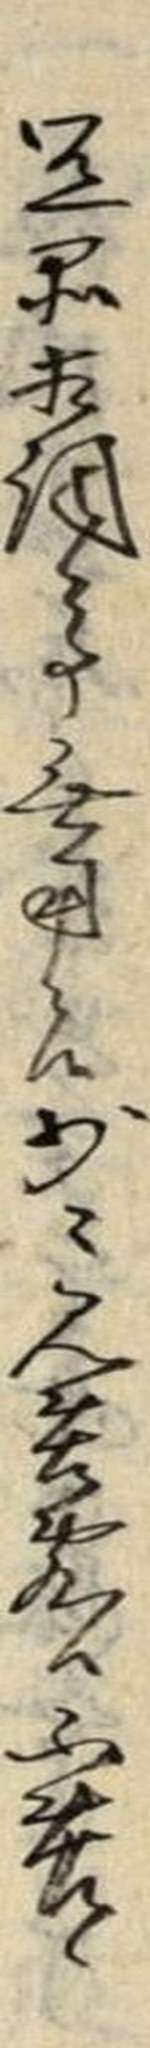宜品相調候事無用に候少々見苦敷は不苦候
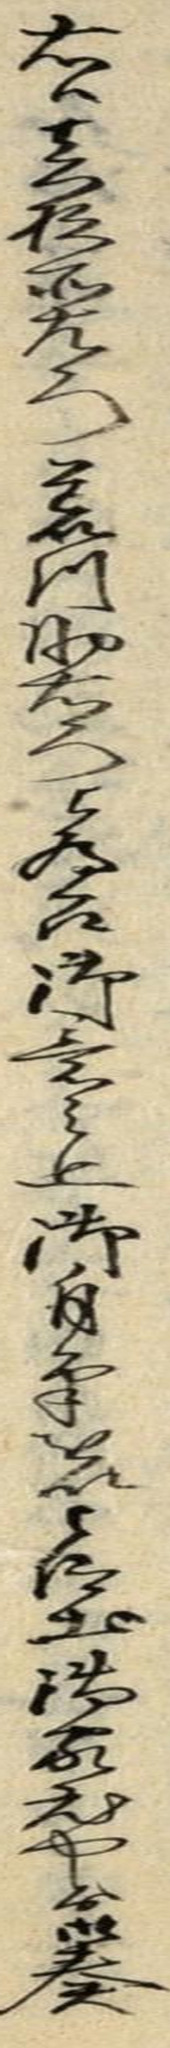右は真杉所左衛門荒川助右衛門被為召御意之上御自筆を以被仰出御家老中ゟ御奏
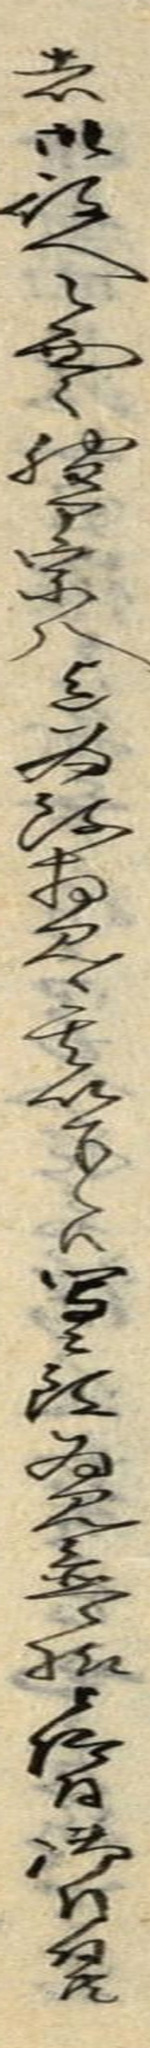者御役人之面々服部宗八迄為致拝見候其以下へは写に致為見置候様被仰付御目付共
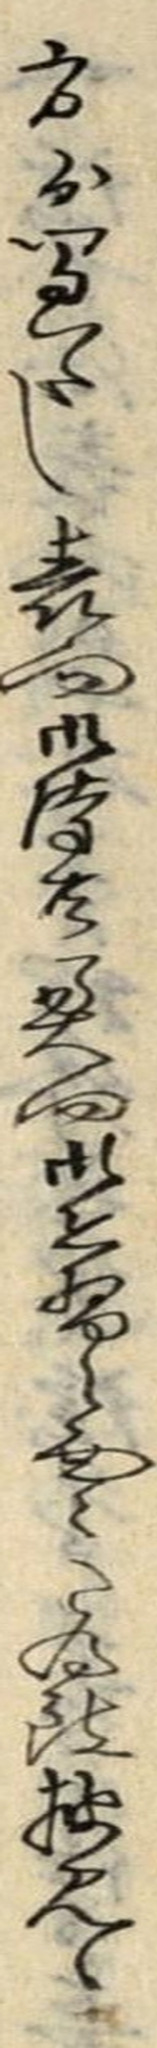方ゟ写いたし表向御侍共奥向御近習之面々へ為致披見候
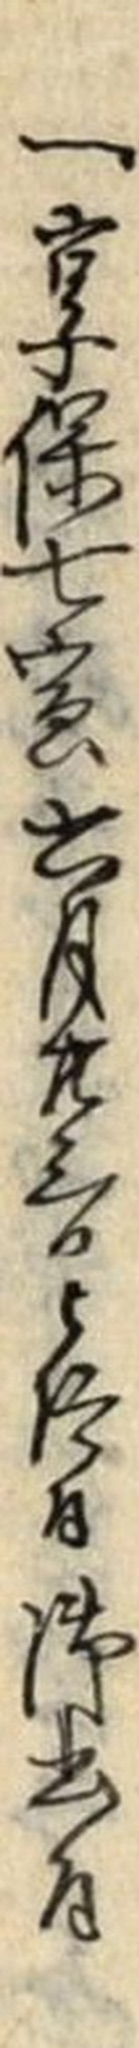一享保七寅六月廿三日被仰付御書付
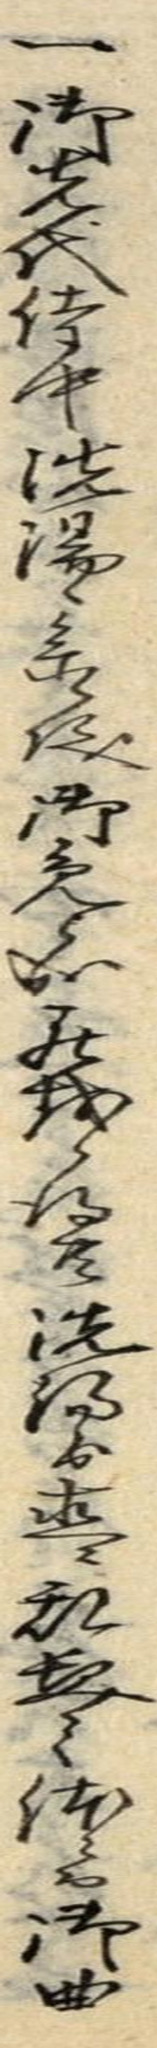一御先代侍中洗湯へ参候儀御免被成候得共洗湯ゟ直に乱髪の体にて御曲
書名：三都并道中之部
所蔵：福井県文書館 Fukui Prefectural Archives
